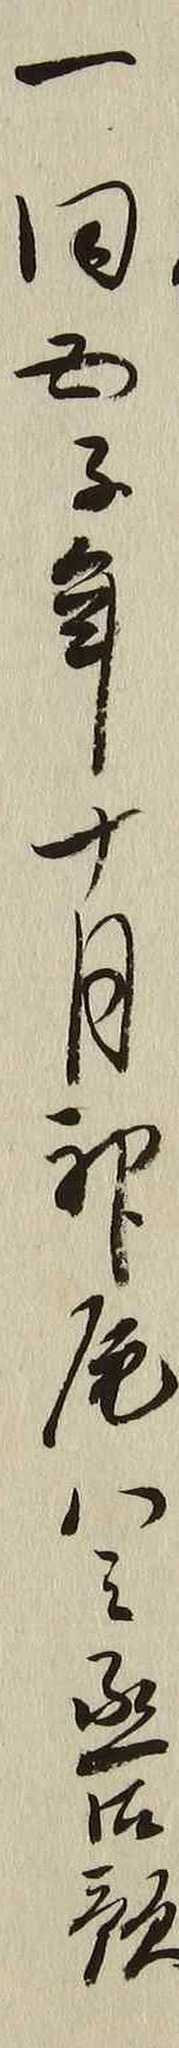一同五子年十月神尾八之丞御預
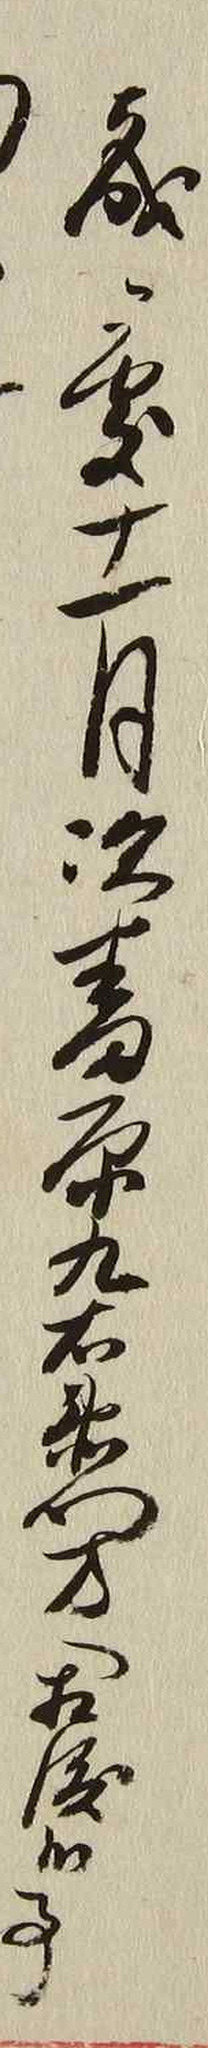被成候処十一月次番原九右衛門方へ相渡候事
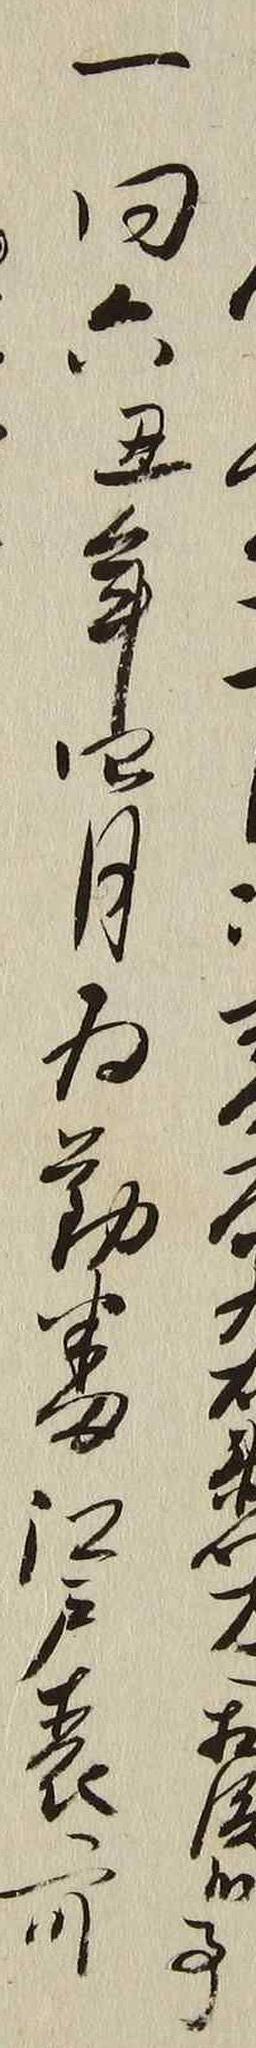一同六丑年四月為勤番江戸表へ可
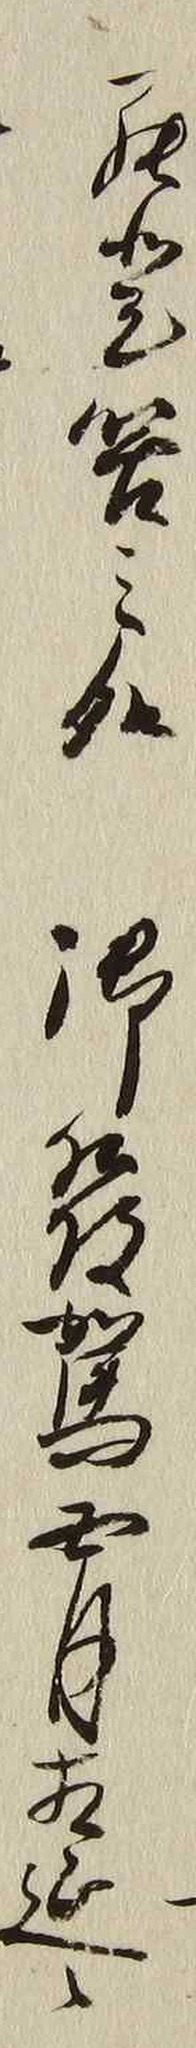罷登筈之処御発駕五月相延候
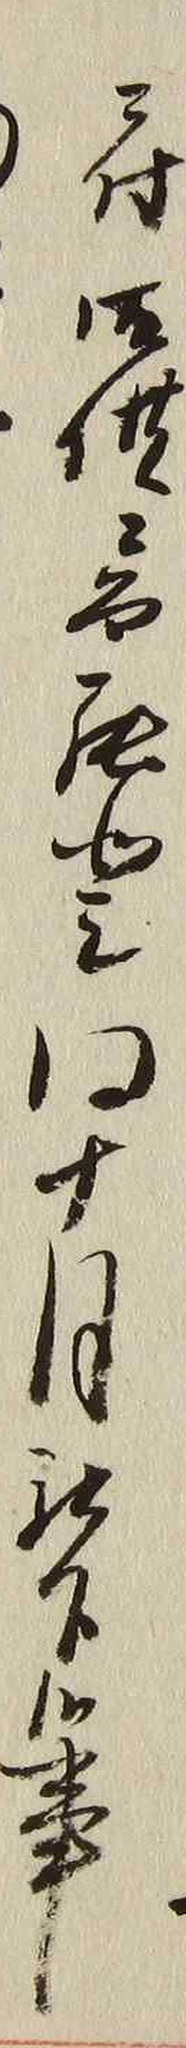ニ付御供ニ而罷登同十月罷下候事
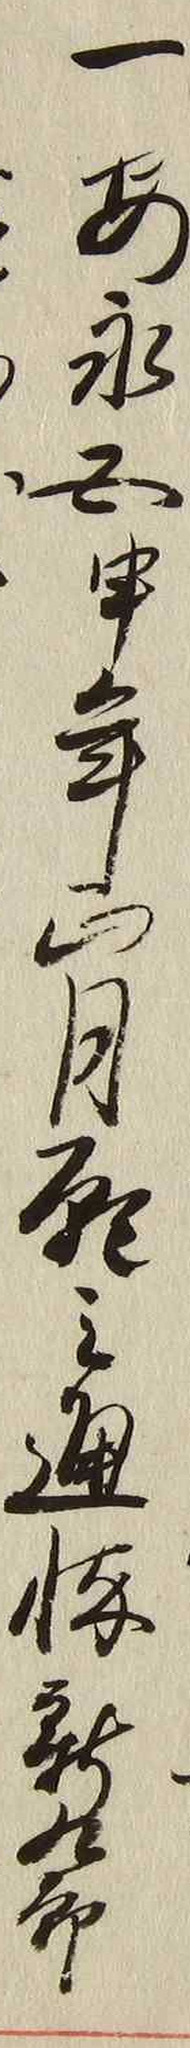一安永五申年六月願之通忰新九郎
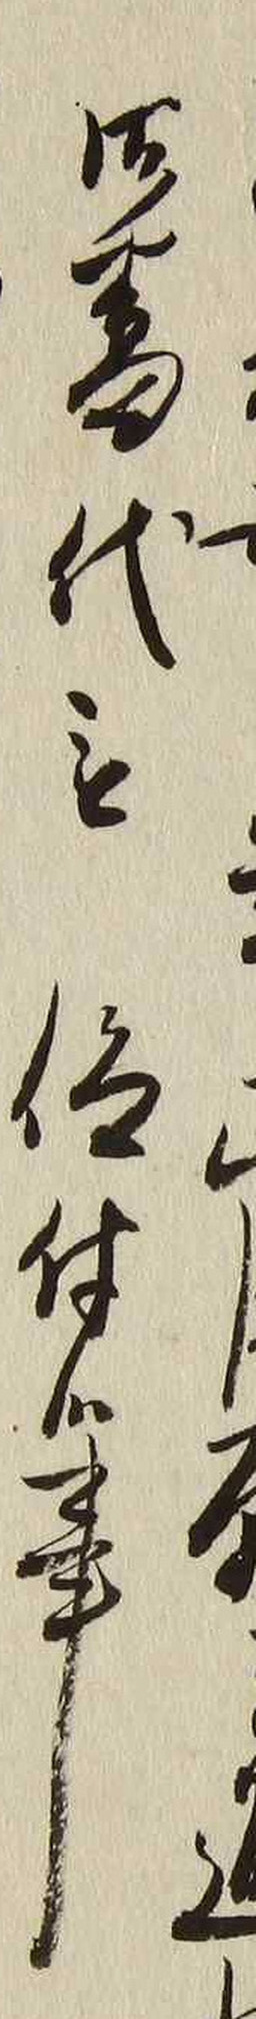御番代被仰付候事
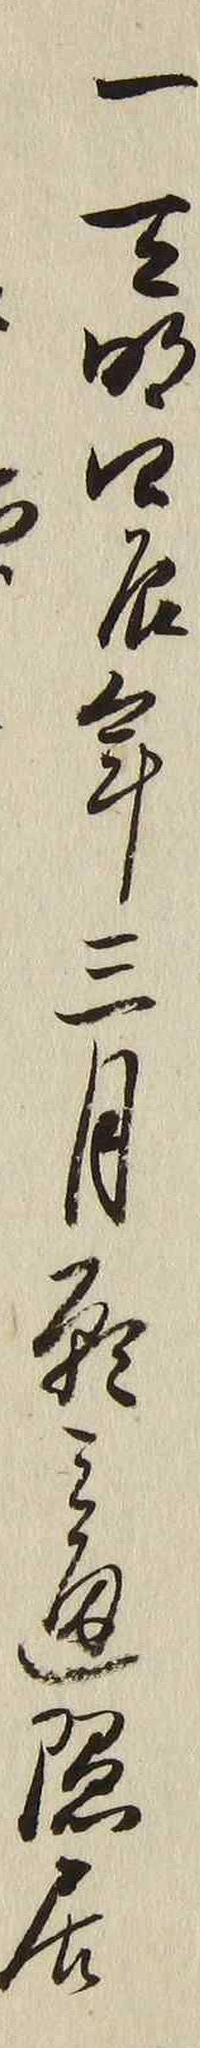一天明四辰年三月願之通隠居
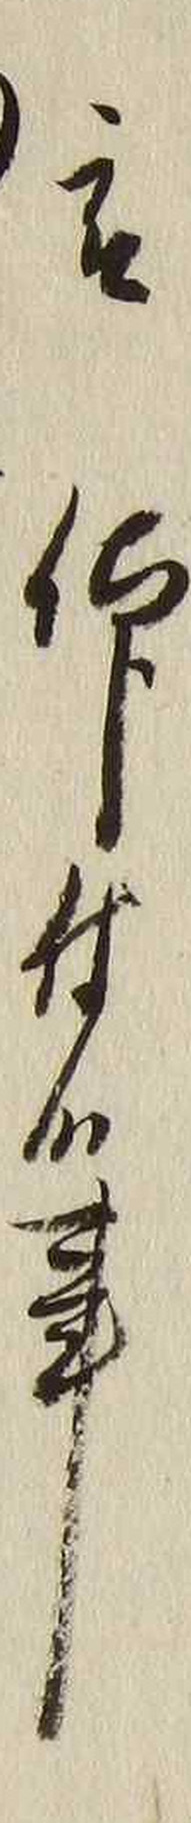被仰付候事
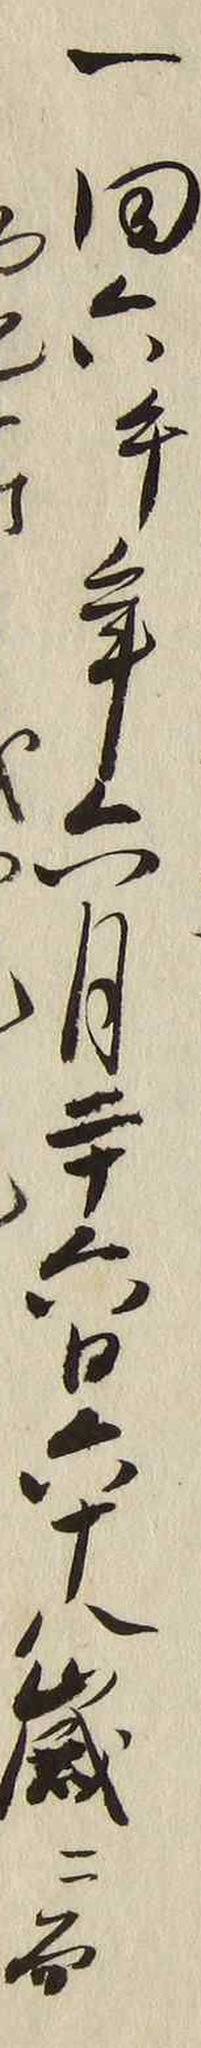一同六午年六月二十六日六十八歳ニ而
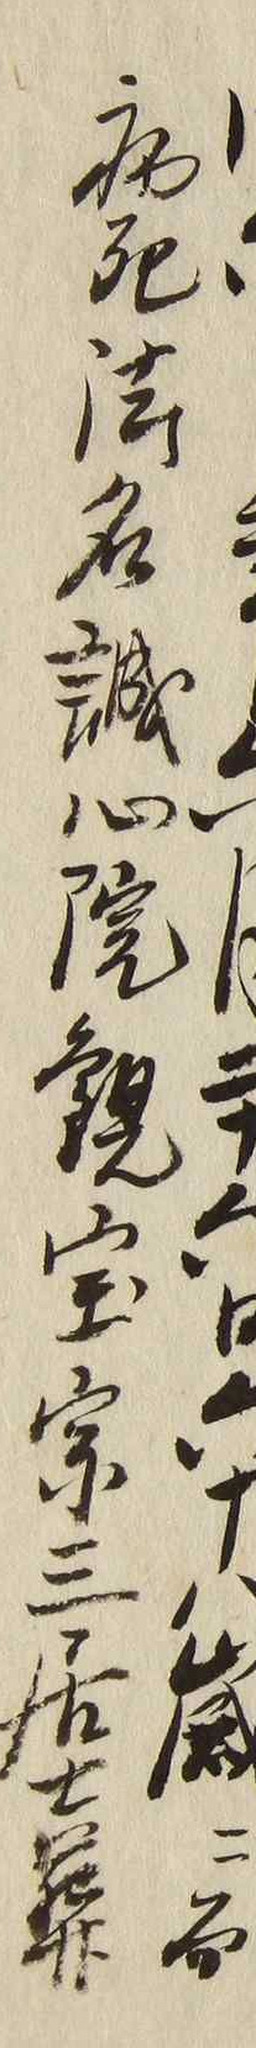病死法名誠心院観宝宗三居士葬

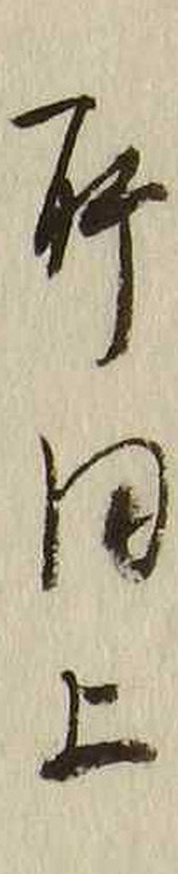所同上
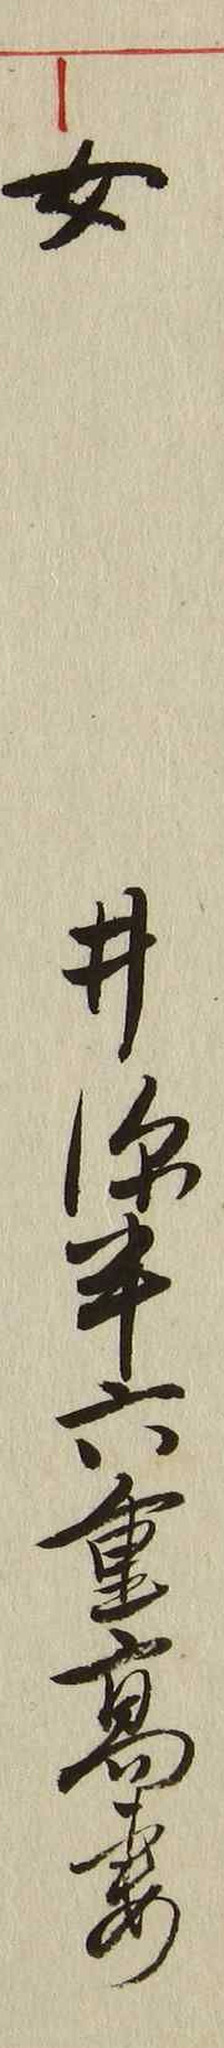女井深半六重高妻
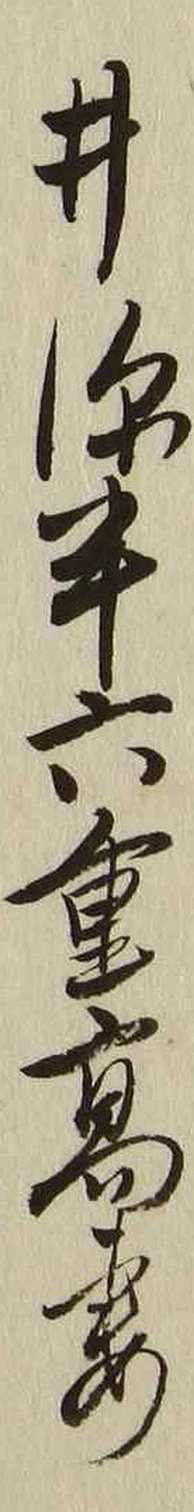女井深半六重高妻
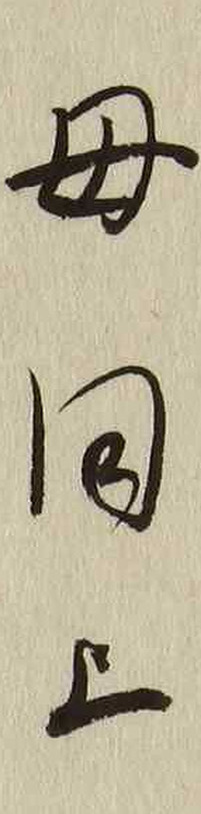母同上
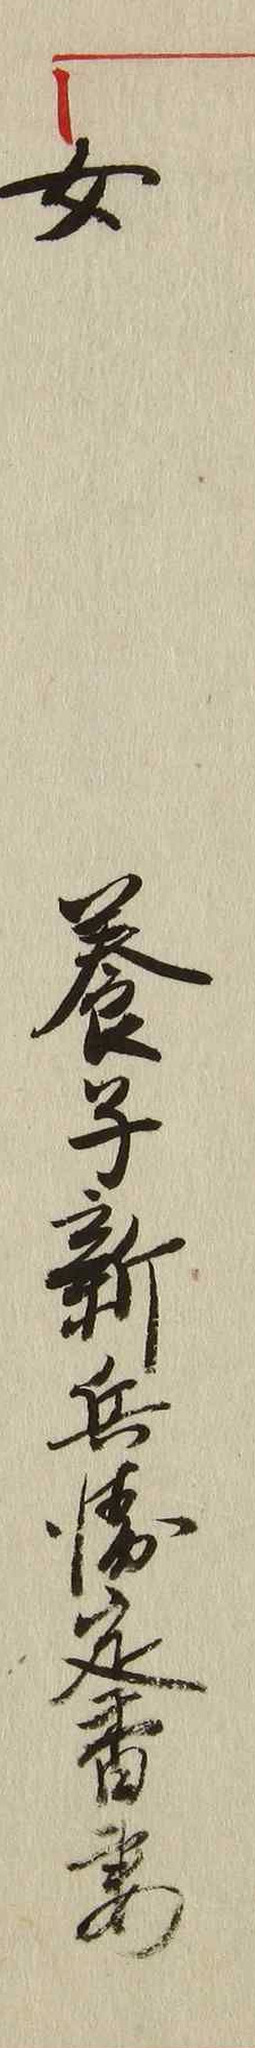女養子新兵衛定香妻
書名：諸士系譜　巻之348　も之部4
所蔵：会津若松市立会津図書館
